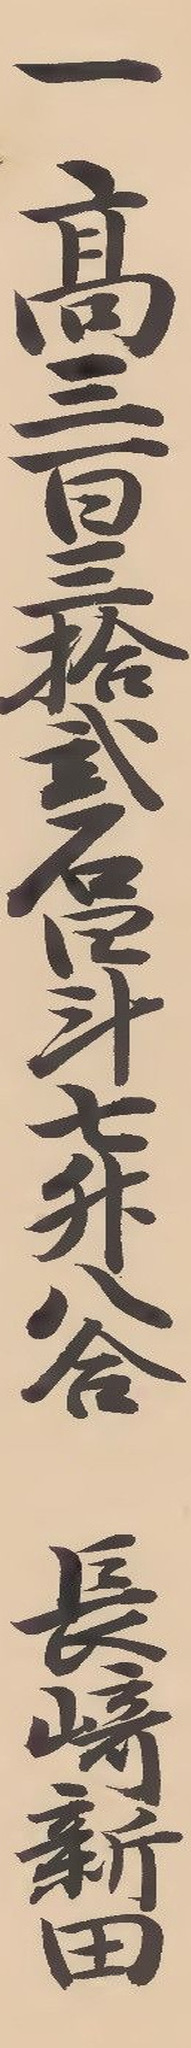一高三百三拾弐石四斗七升八合長崎新田
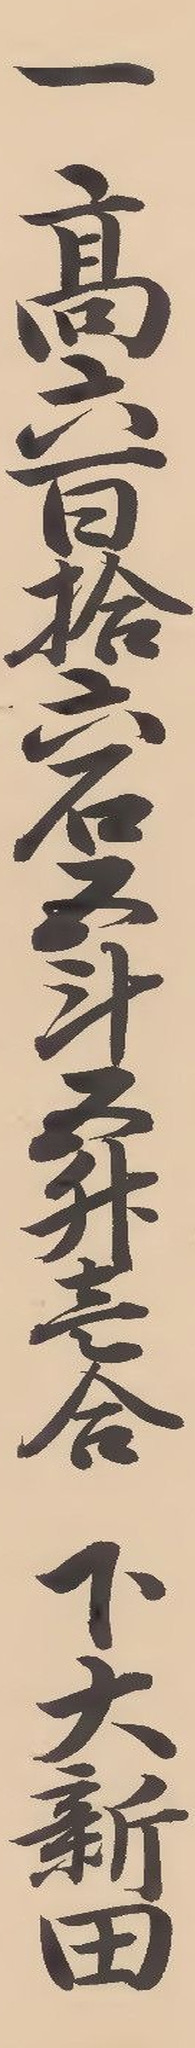一高六百拾六石五斗五升壱合下大新田
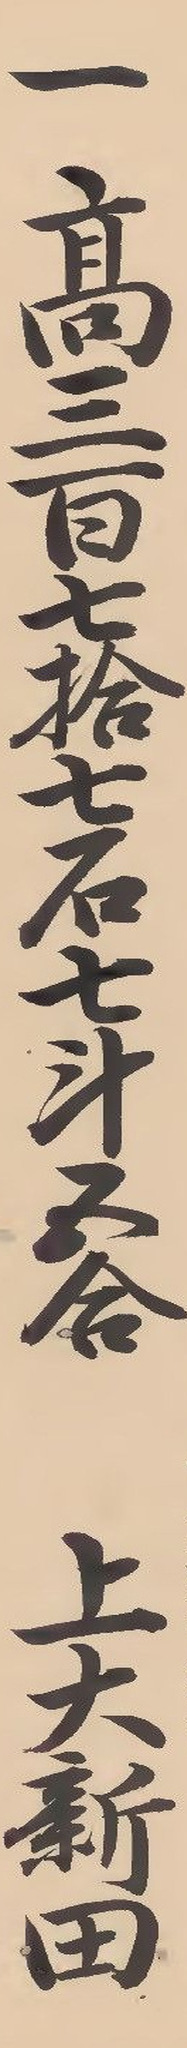一高三百七拾七石七斗五合上大新田

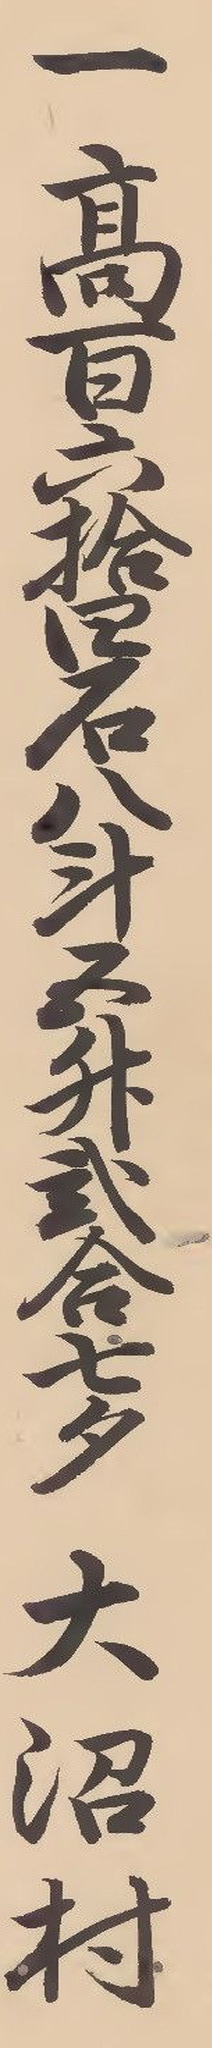一高百六拾四石八斗五升弐合七勺大沼村
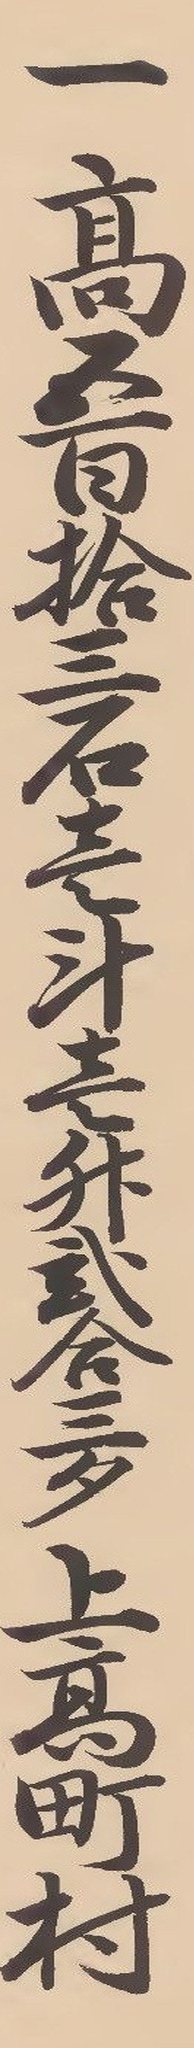一高五百拾三石壱斗壱升弐合三勺上高町村
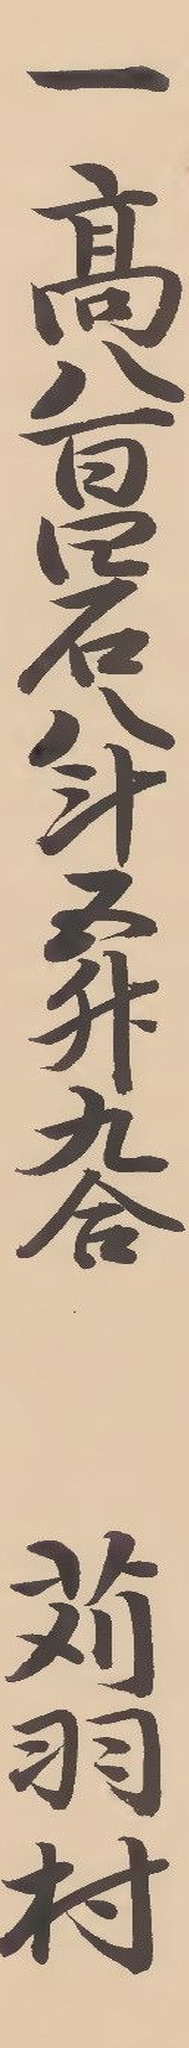一高八百四石八斗五升九合苅羽村
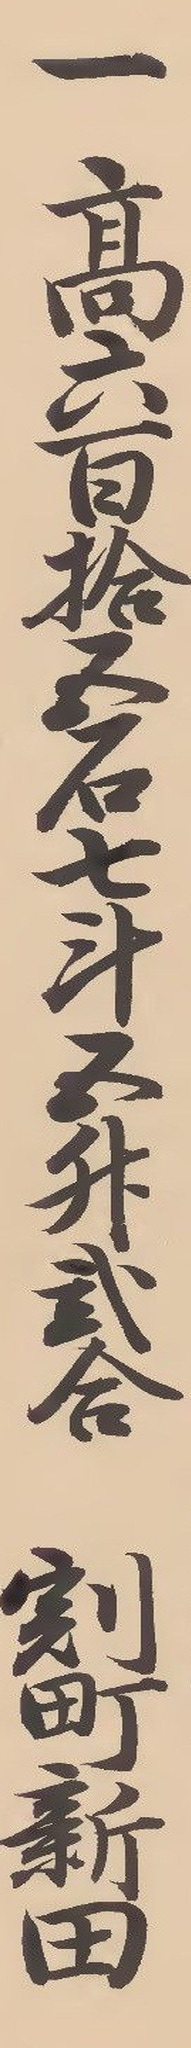一高六百拾五石七斗五升弐合割町新田
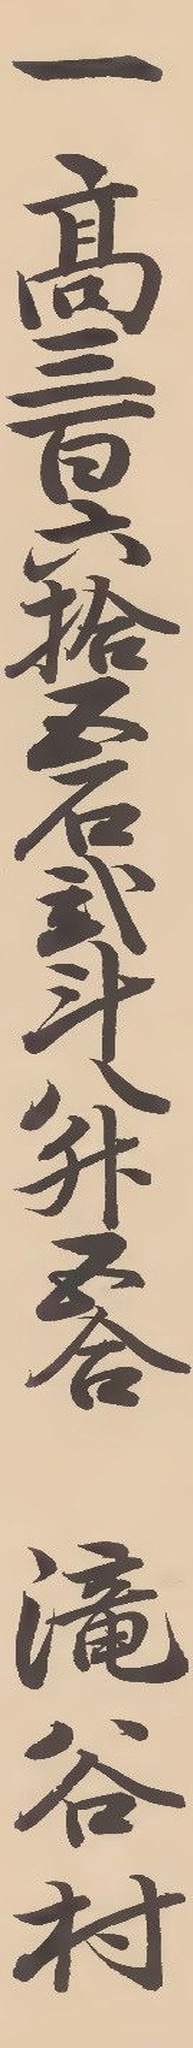一高三百六拾五石弐斗八升五合滝谷村
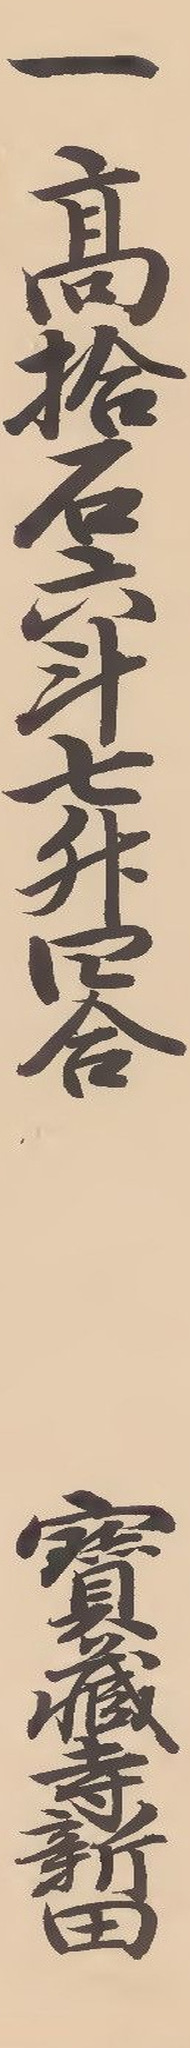一高拾石六斗七升四合宝蔵寺新田
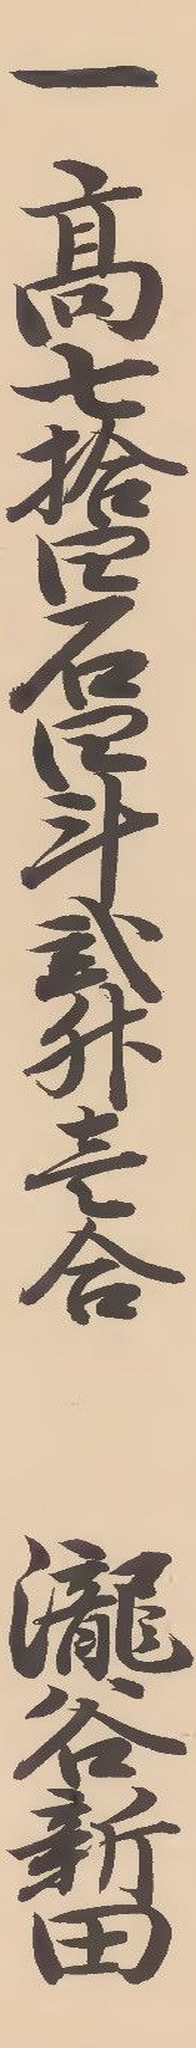一高七拾四石四斗弐升壱合滝谷新田
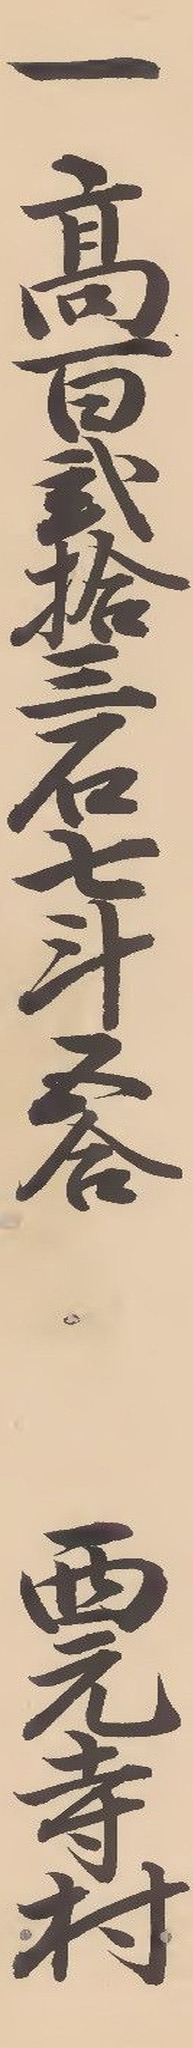一高百弐拾三石七斗五合西元寺村

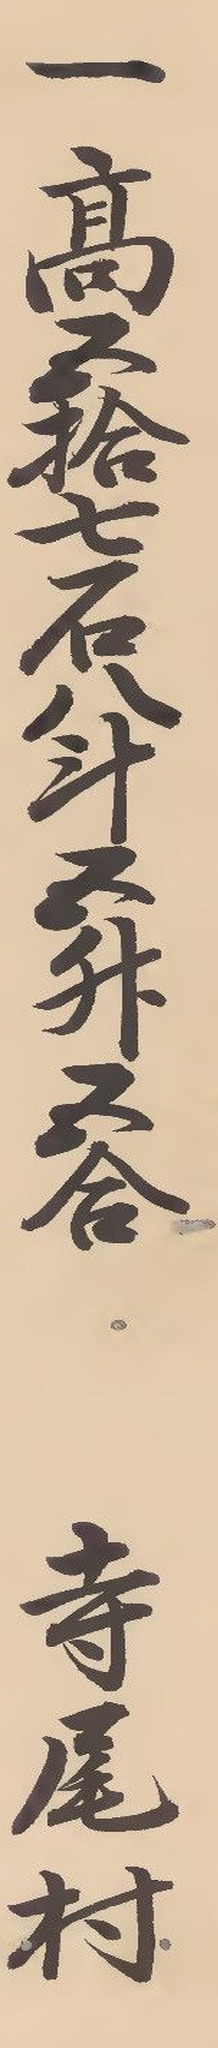一高五拾七石八斗五升五合寺尾村
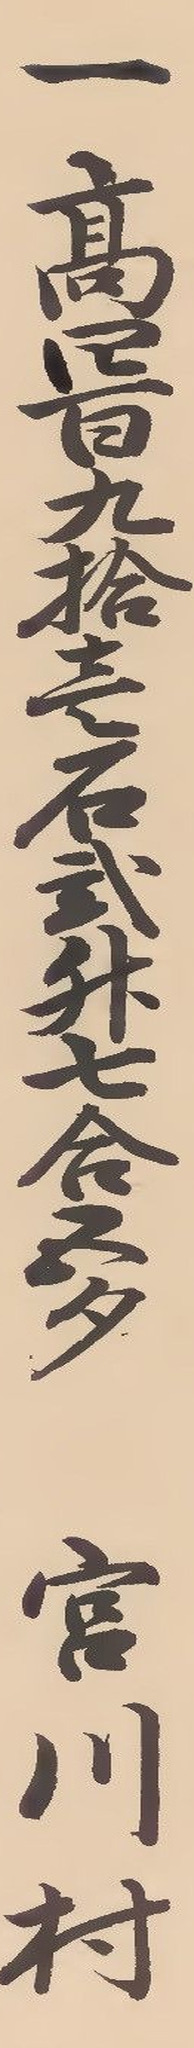一高四百九拾壱石弐升七合五勺宮川村
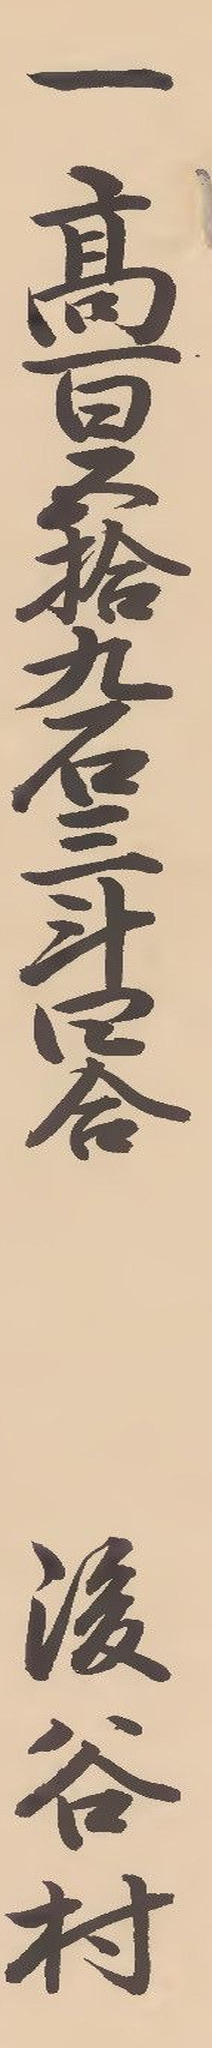一高百五拾九石三斗四合後谷村
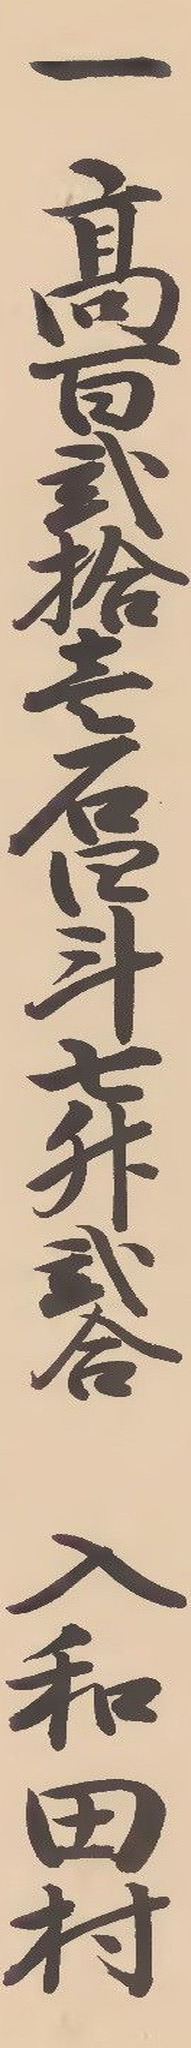一高百弐拾壱石四斗七升弐合入和田村
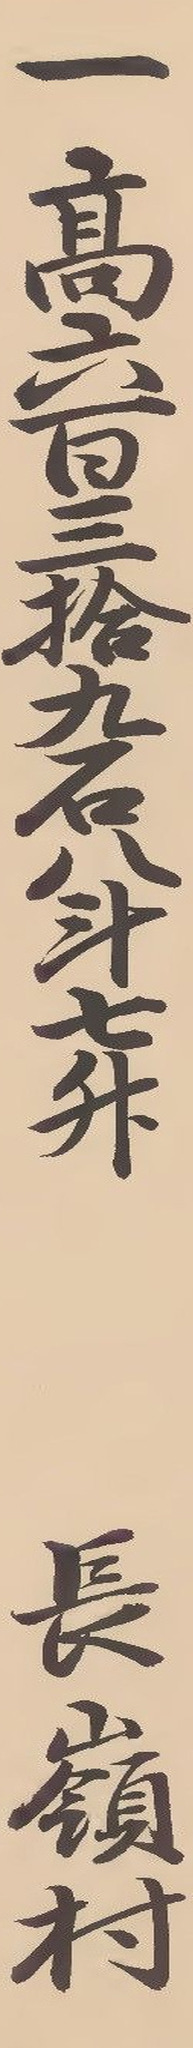一高六百三拾九石八斗七升長嶺村
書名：越後国郷帳　中
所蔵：国立公文書館 National Archives of Japan
